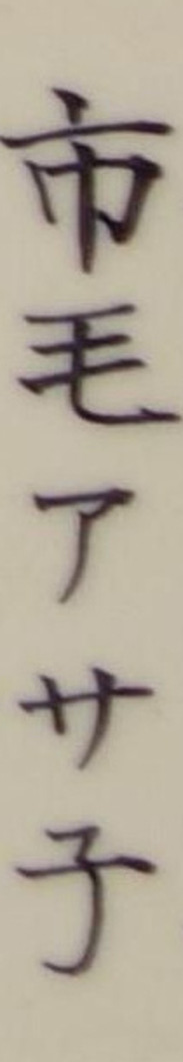市毛アサ子
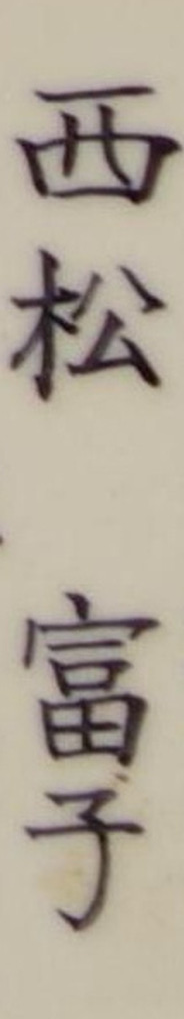西松富子
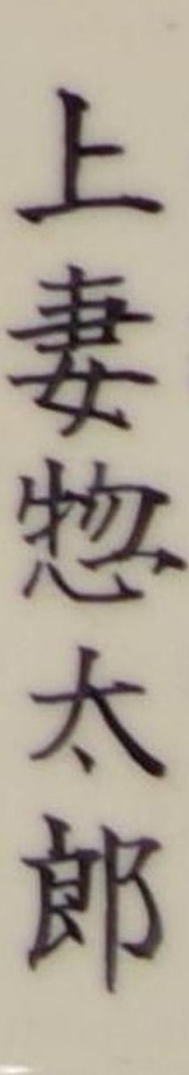上妻惣太郎
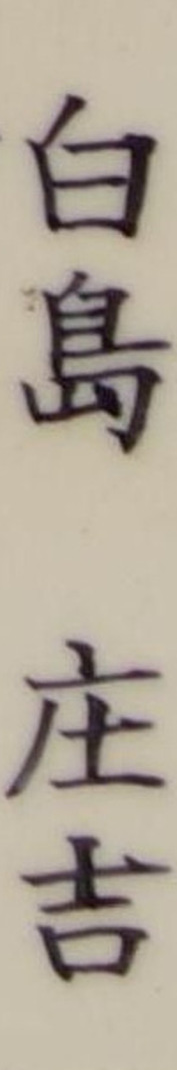白島庄吉
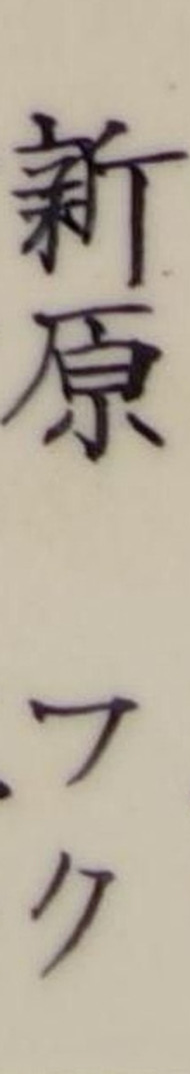新原フク
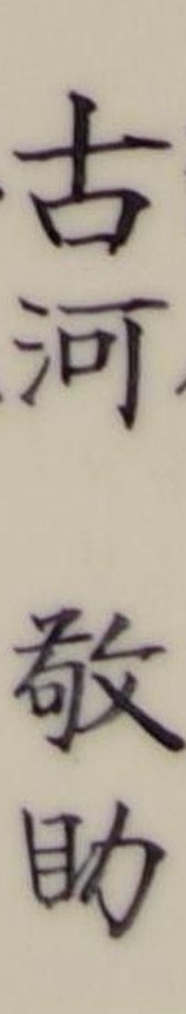古河敬助
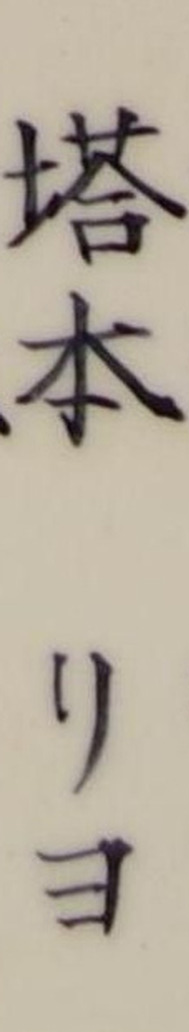塔本リヨ
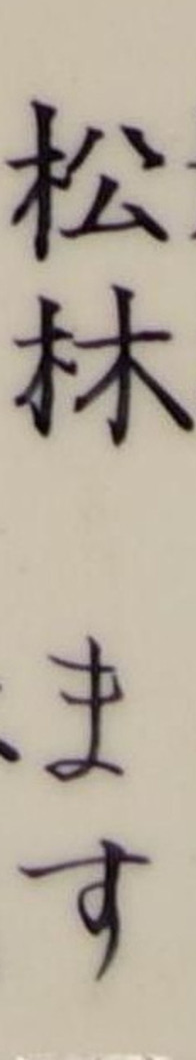松林ます
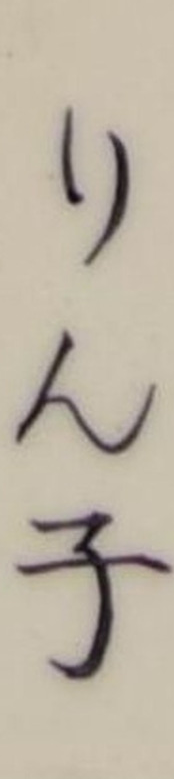りん子
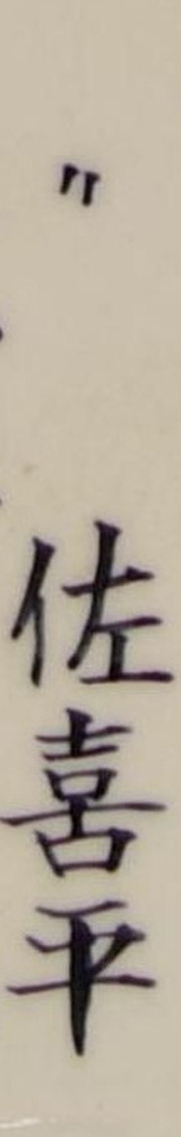佐喜平
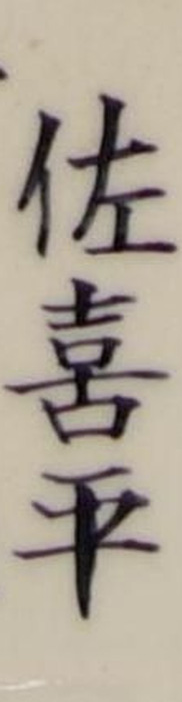佐喜平
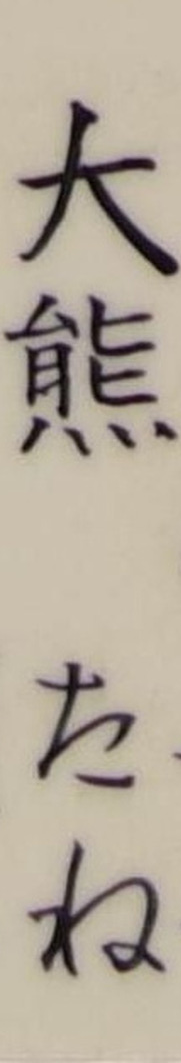大熊たね
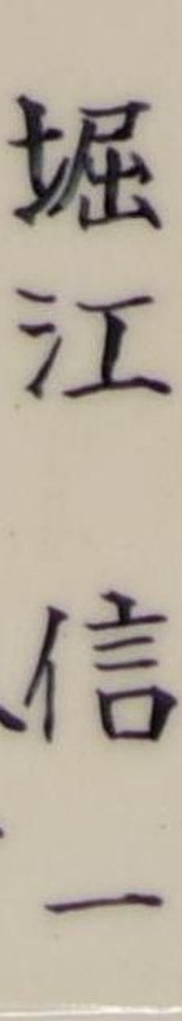堀江信一
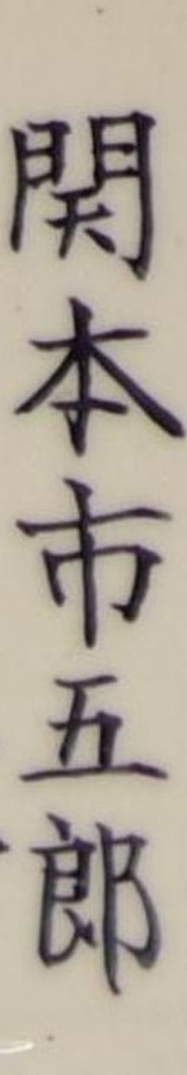関本市五郎
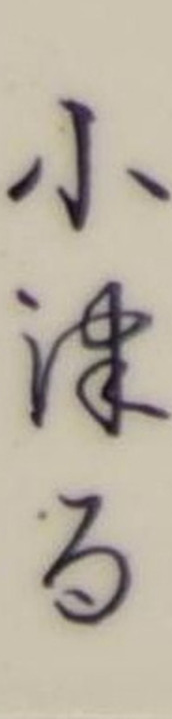小つる
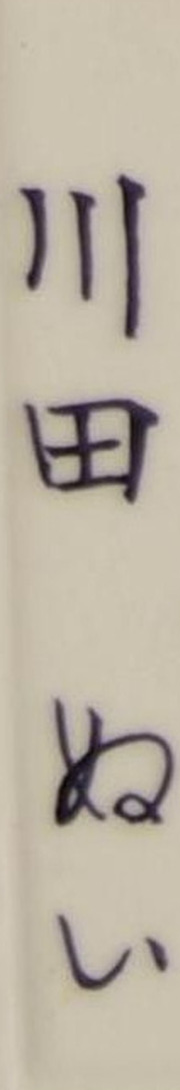川田ぬい
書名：E~L
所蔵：高野山金剛峯寺
